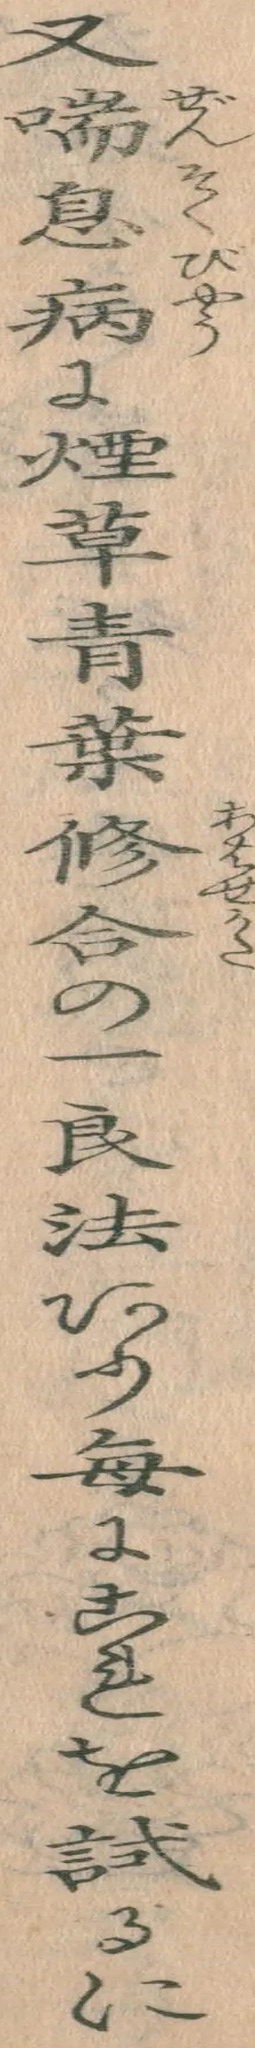又喘息病に煙草青葉修合の一良法あり毎にこれを試るに
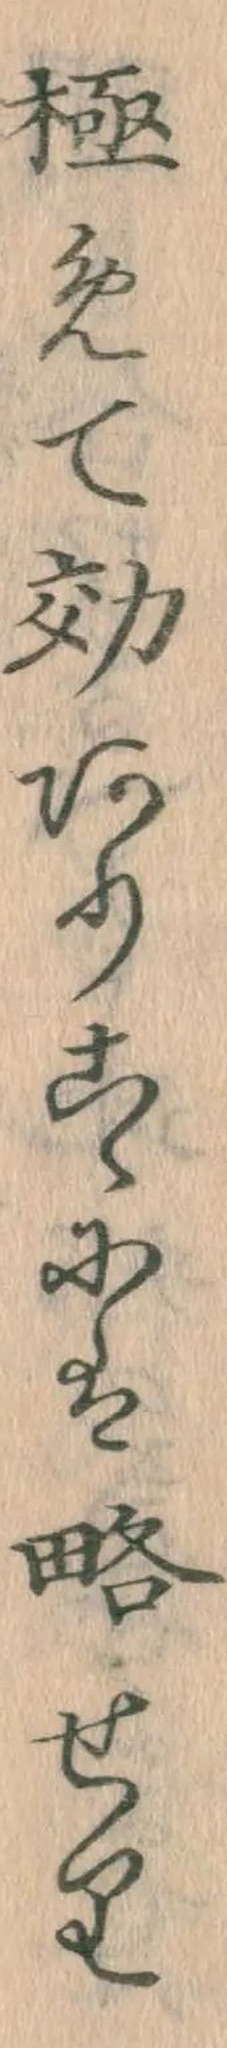極めて効ありこゝには略せり
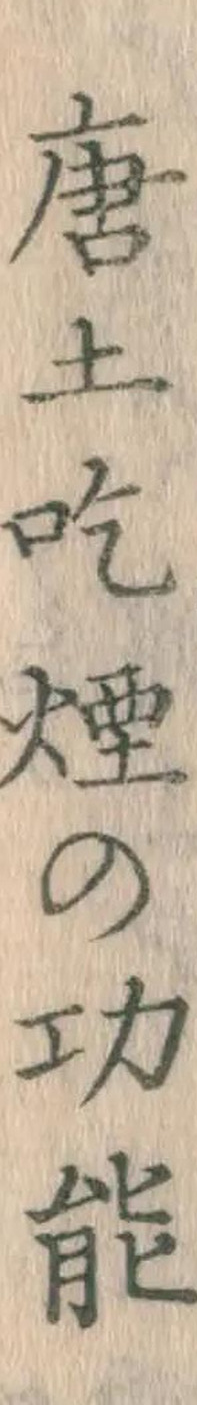唐土吃煙の功能
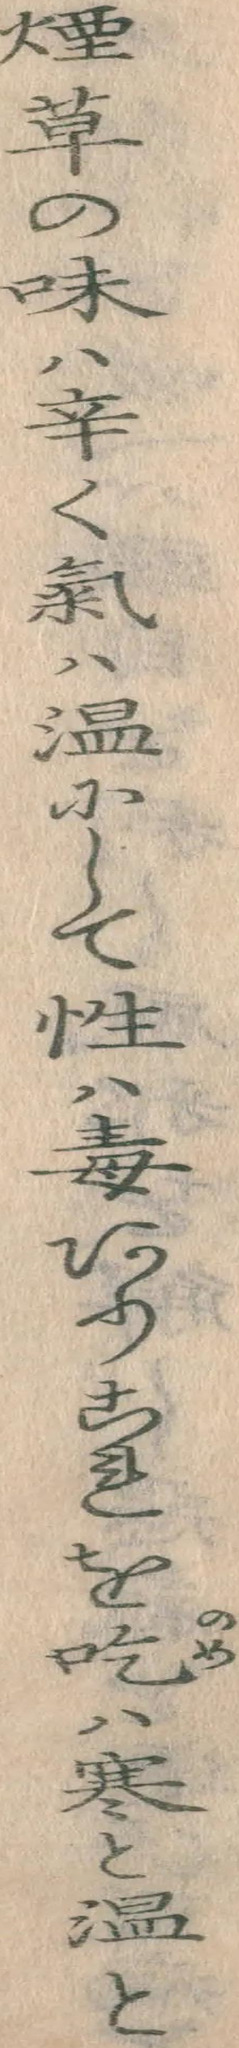煙草の味は辛く気は温にして性は毒ありこれを吃は寒と温と
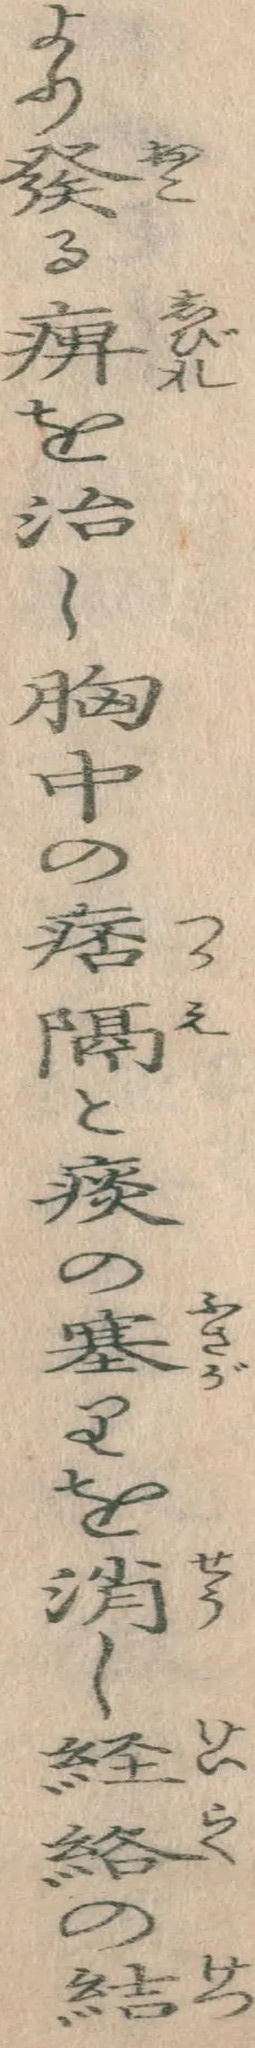より発る痺を治し胸中の痞隔と痰の塞りを消し経絡の結
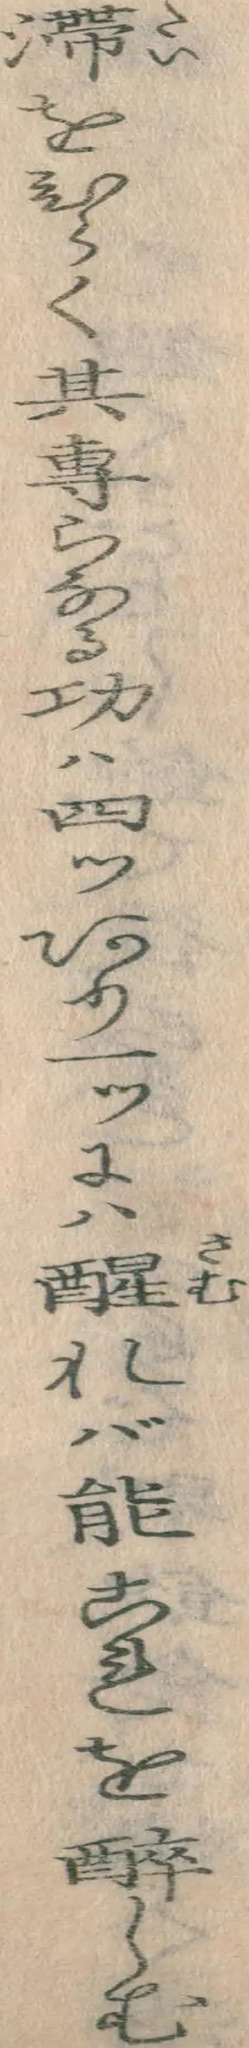滞をひらく其専らなる功は四ッあり一ッには醒れば能これを酔しむ
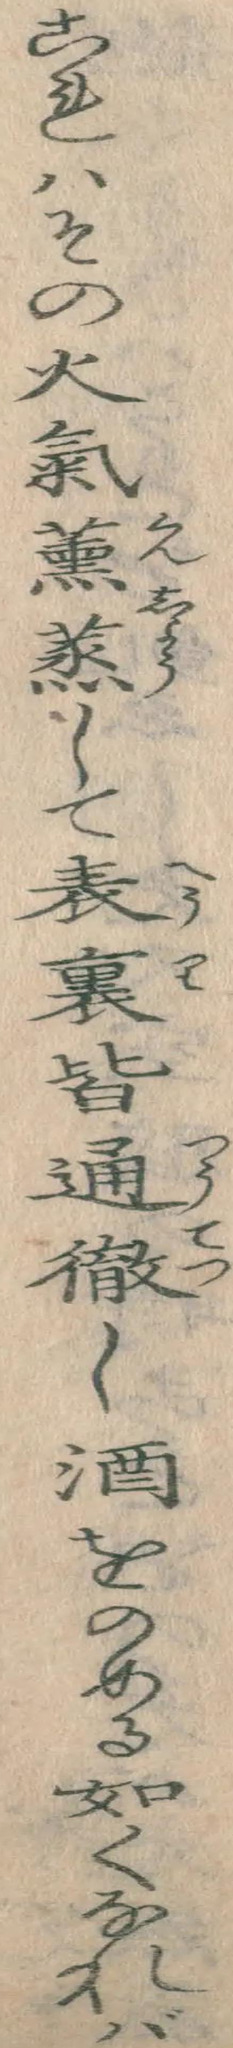これはその火気薫蒸して表裏皆通徹し酒をのめる如くなれば
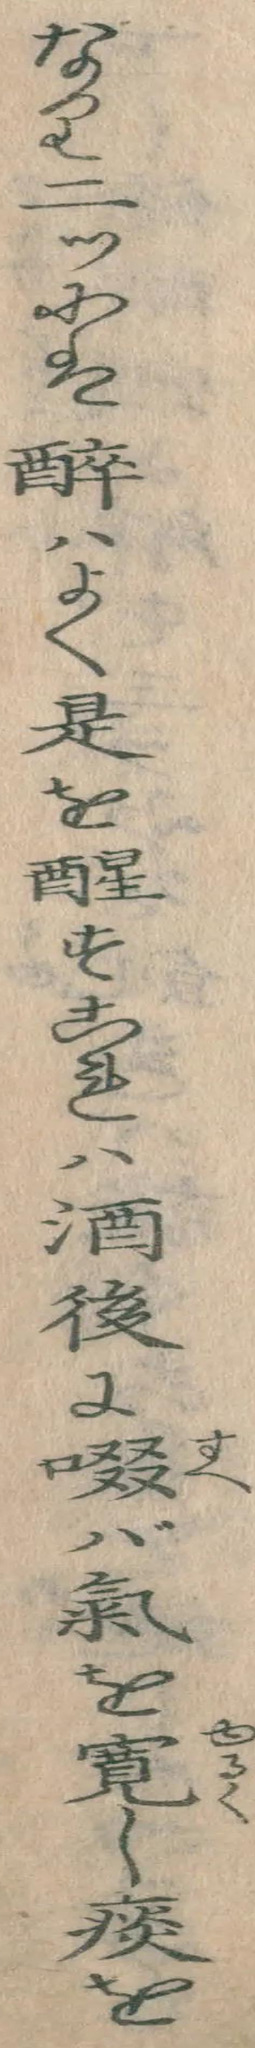なり二ッには酔はよく是を醒すこれは酒後に啜ば気を寛し痰を

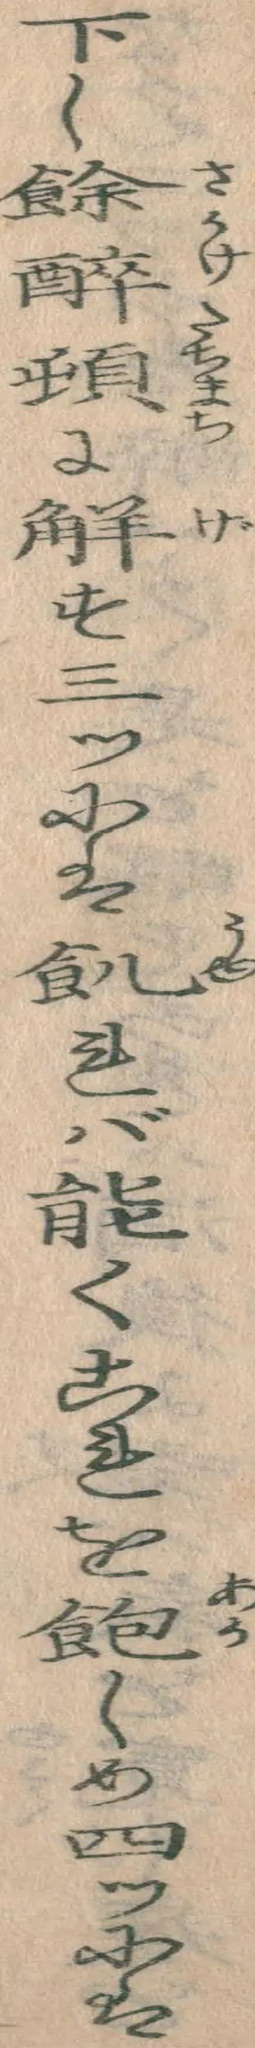下し余酔頓に解す三ッには飢れば能くこれを飽しめ四ッには
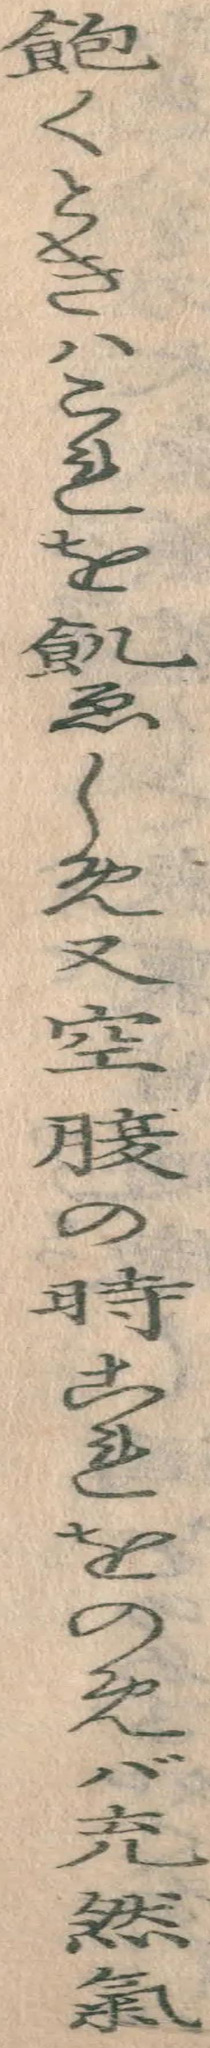飽くときはこれを飢ゑしめ又空腹の時これをのめば充然気
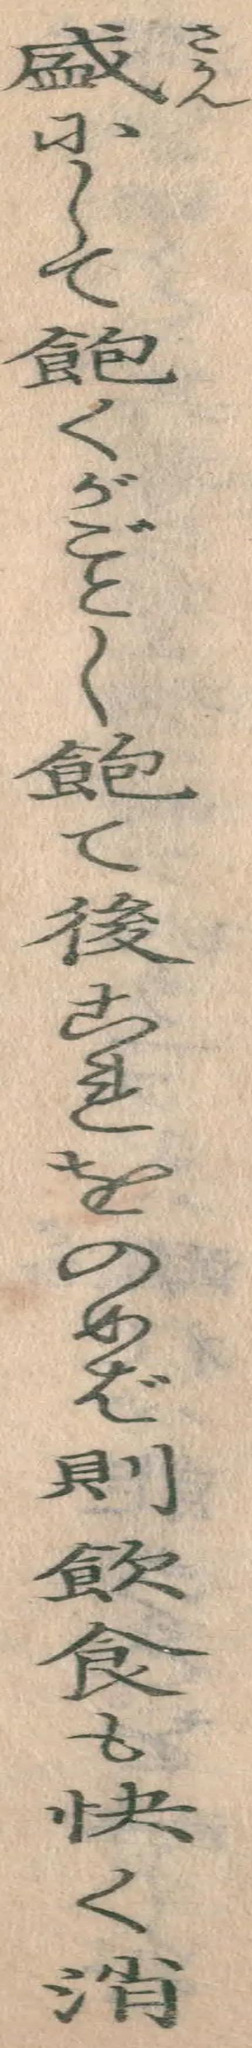盛にして飽くがごとし飽て後これをのめば則飲食も快く消
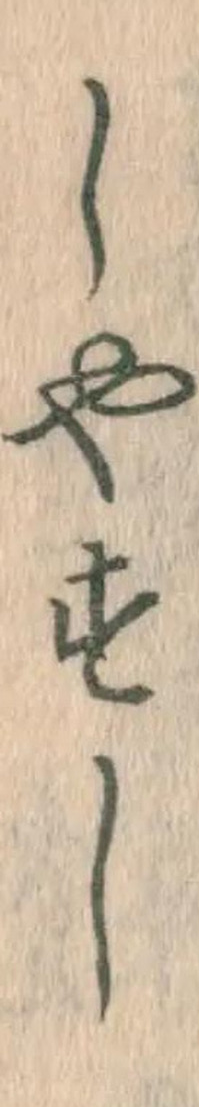しやすし
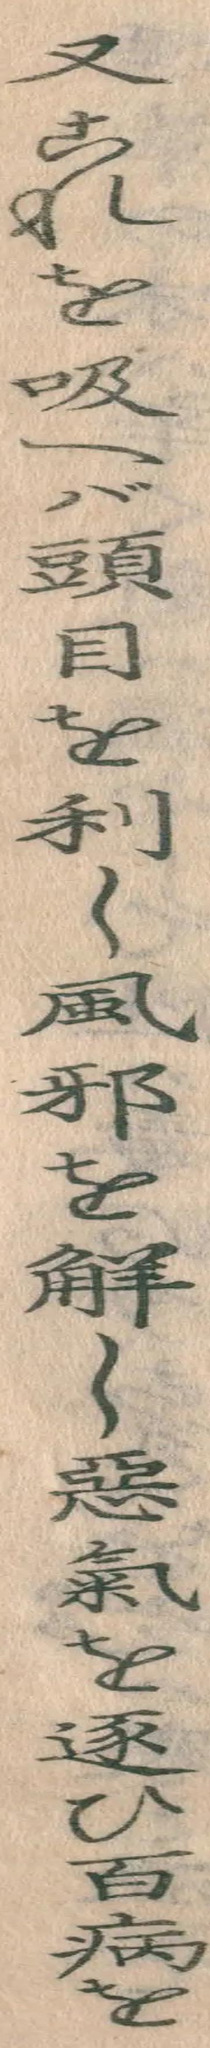又これを吸へば頭目を利し風邪を解し悪気を逐ひ百病を
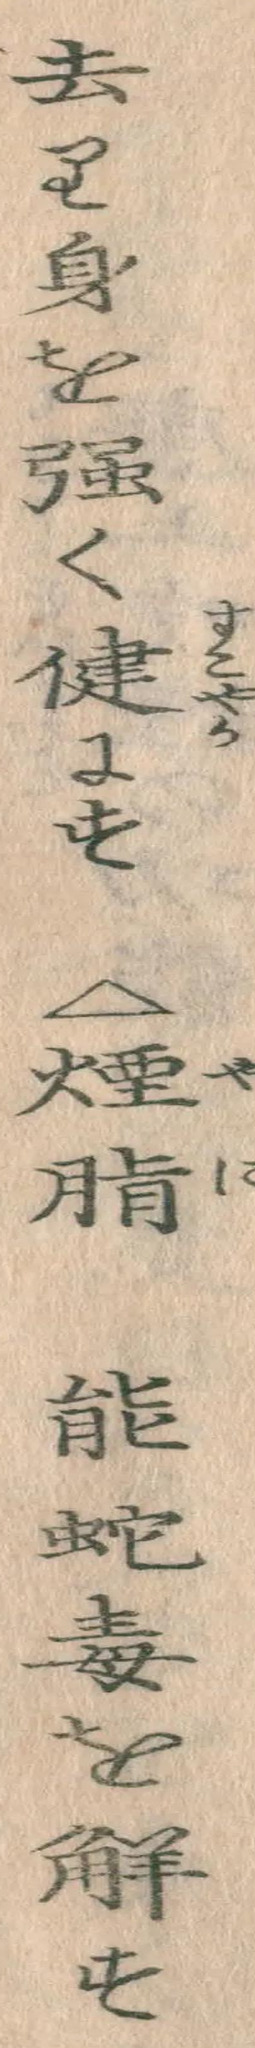去り身を強く健にす△煙脂能蛇毒を解す
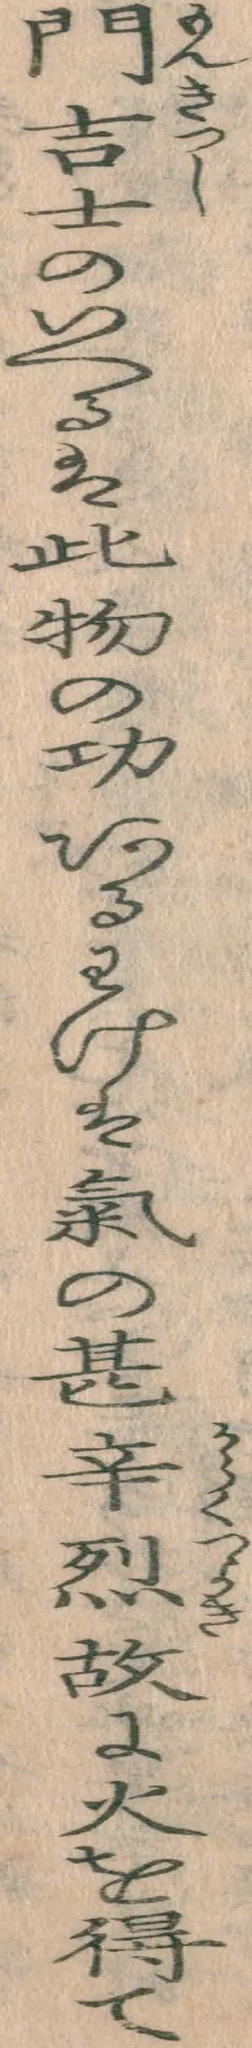門吉士のいへるは此物の功あるわけは気の甚辛烈故に火を得て
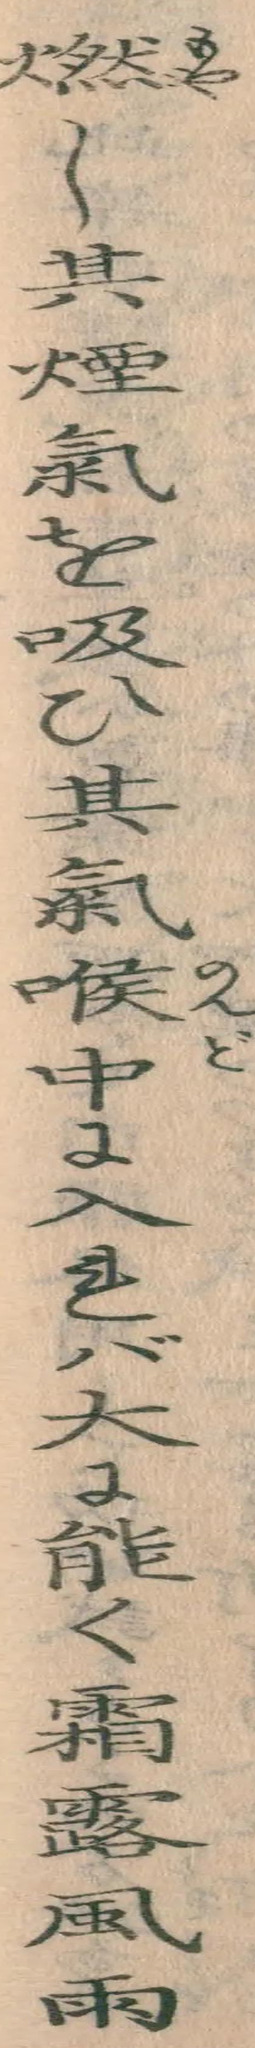燃し其煙気を吸ひ其気喉中に入れば大に能く霜露風雨
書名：目さまし草
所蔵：国立国会図書館 National Diet Library, JAPAN
